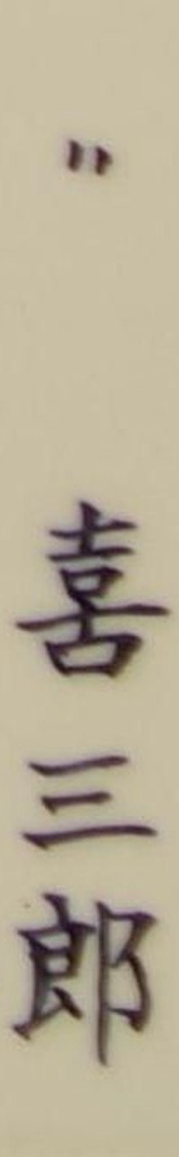喜三郎
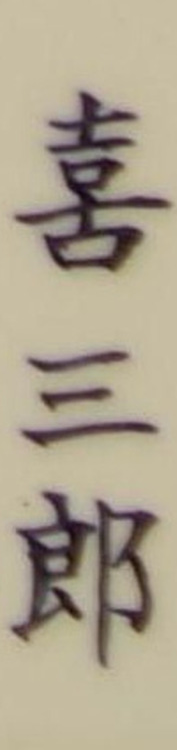喜三郎
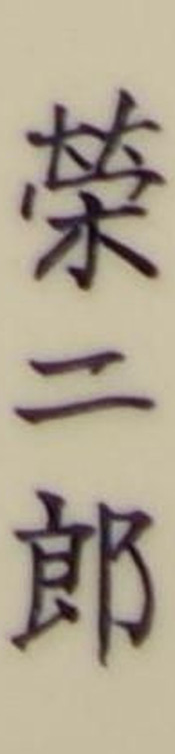榮二郎
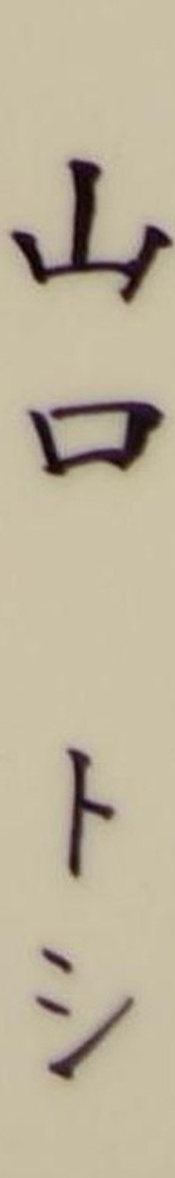山口トシ
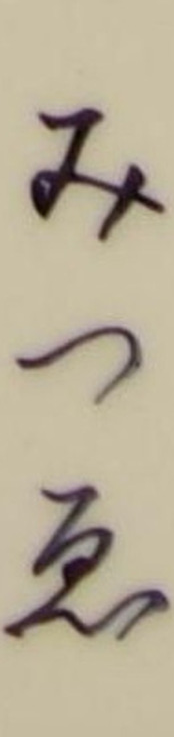みつゑ
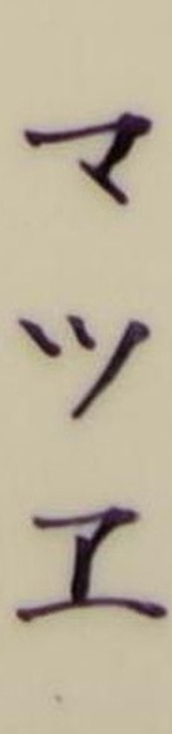マツエ
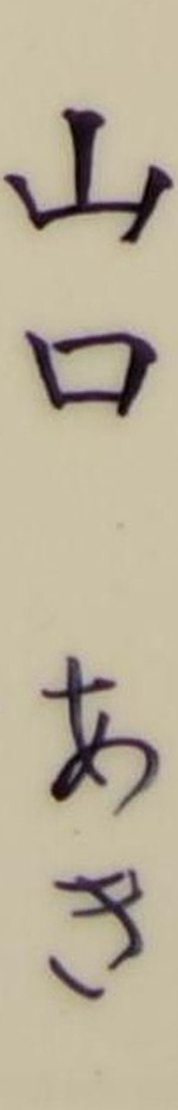山口あき
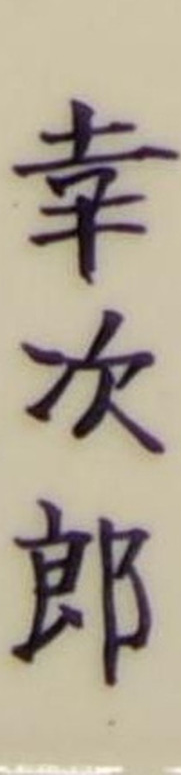幸次郎
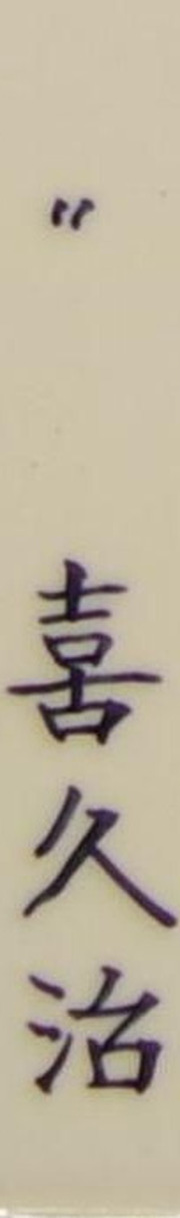喜久治
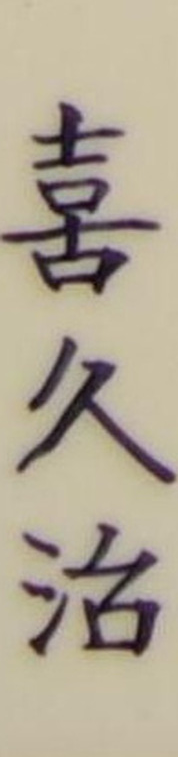喜久治
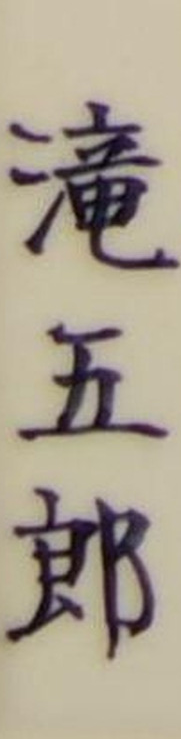滝五郎

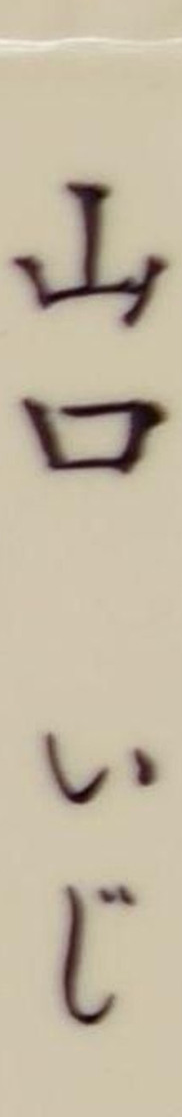山口いじ
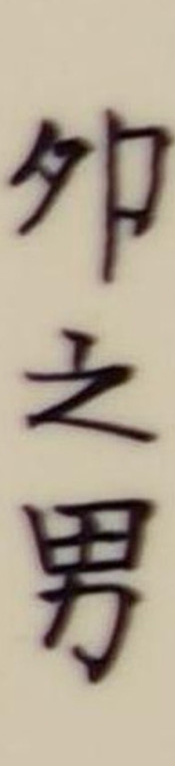卯之男
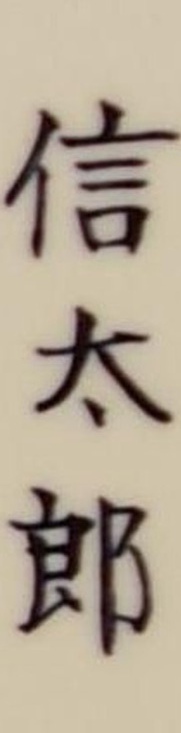信太郎
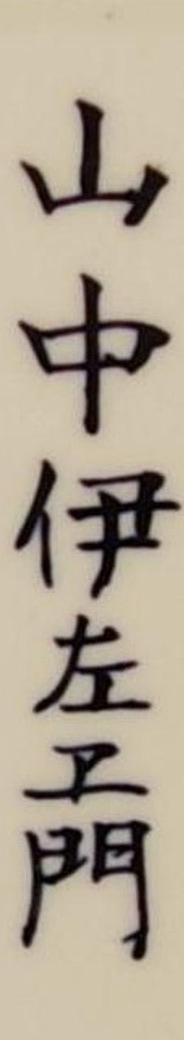山中伊左エ門
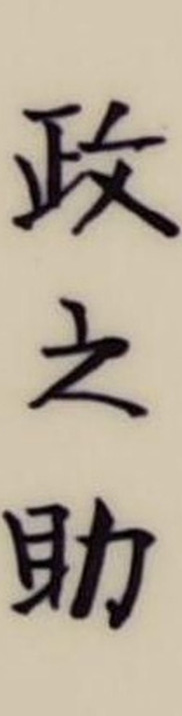政之助
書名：A~D
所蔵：koyasan kongobuji
